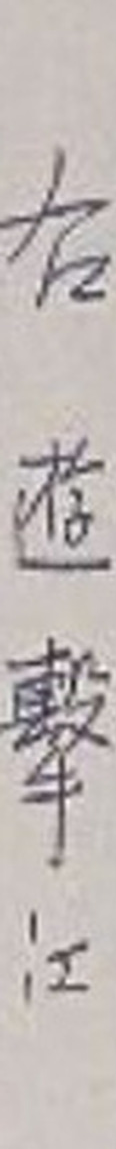右遊撃え
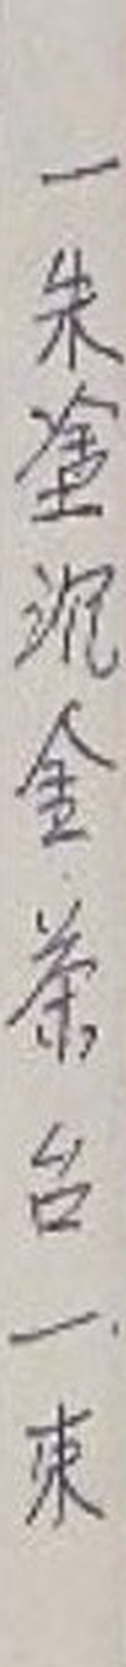一朱塗沈金茶台一束
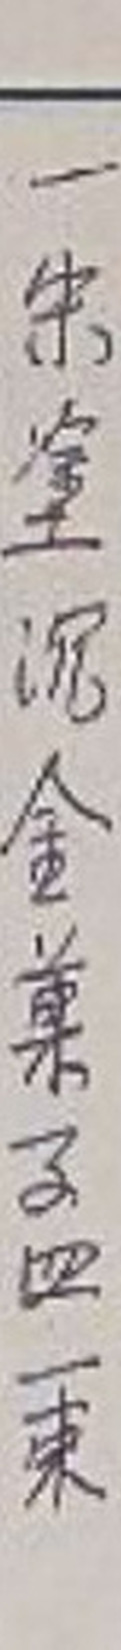一朱塗沈金茶台一束
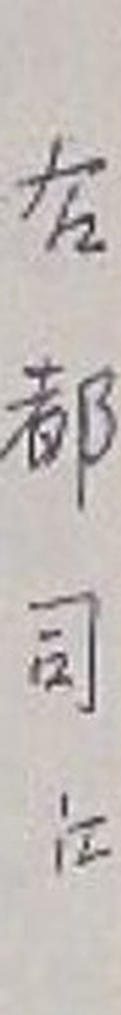右都司え
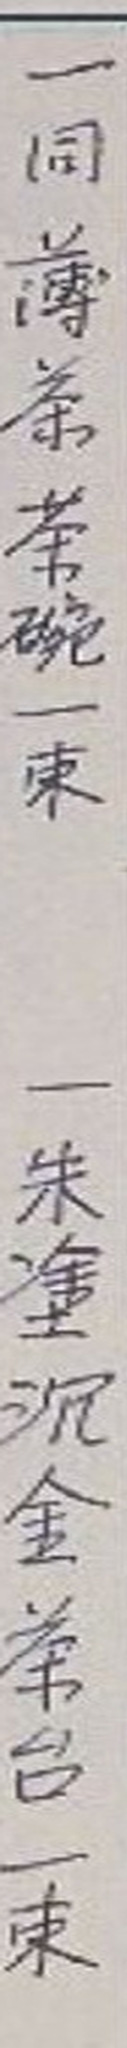一同薄茶茶碗一束一朱塗沈金茶台一束
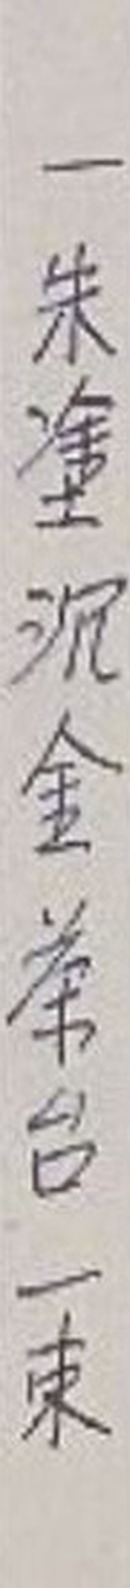一朱塗沈金茶台一束
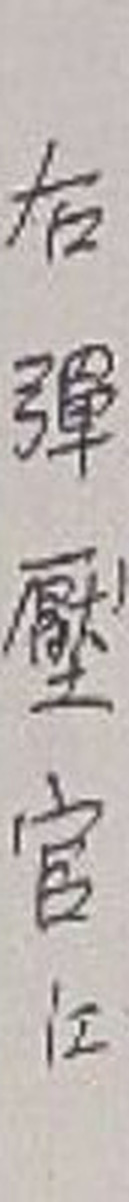右弾圧官え

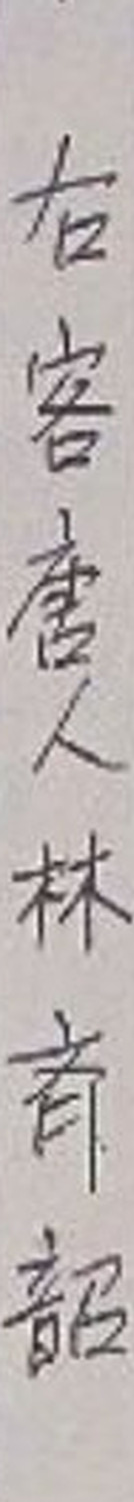右客唐人林斉韶
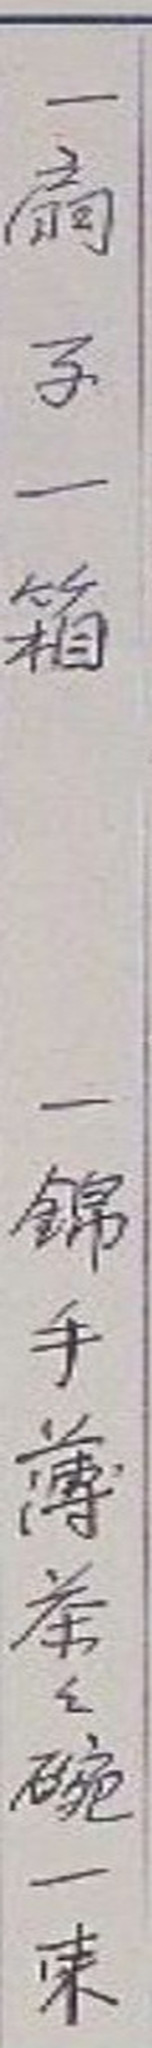一扇子一箱一錦手薄茶々碗一束
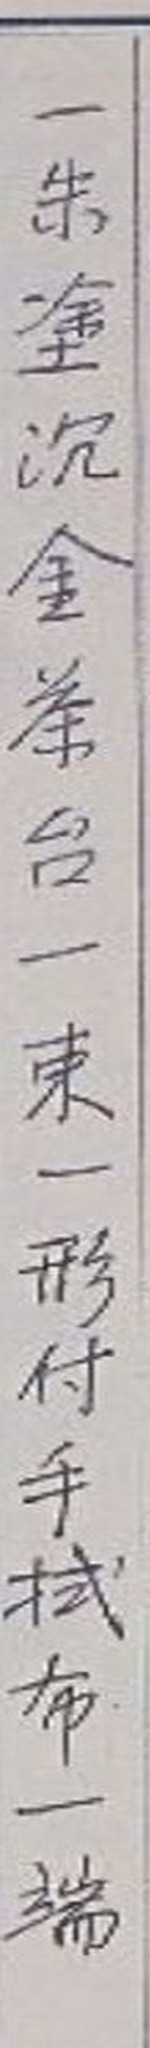一朱塗沈金茶台一束一形付手拭布一端
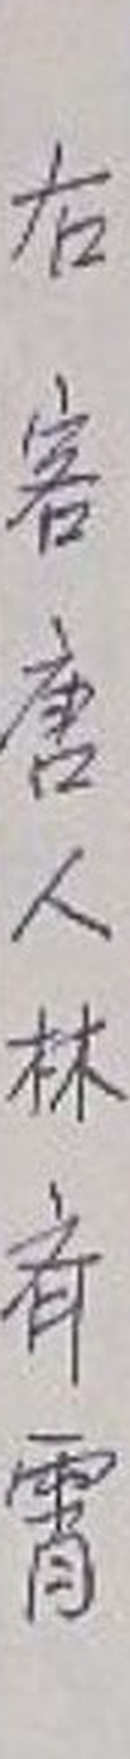右客唐人林斉霄
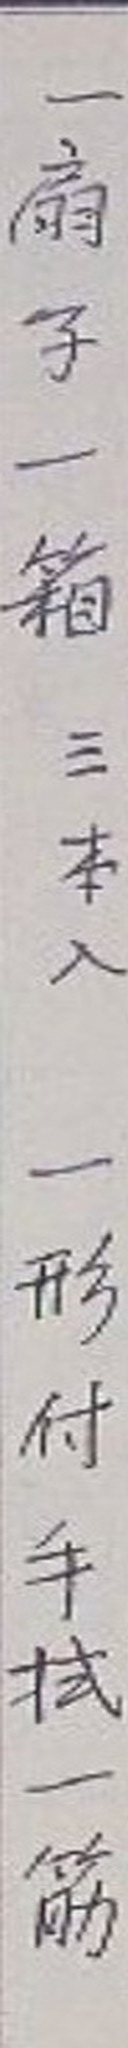一扇子一箱三本入一形付手拭一筋
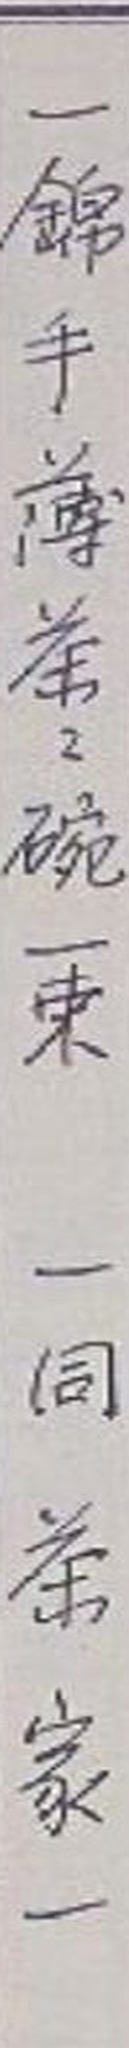一錦手薄茶々碗一束一同茶家一
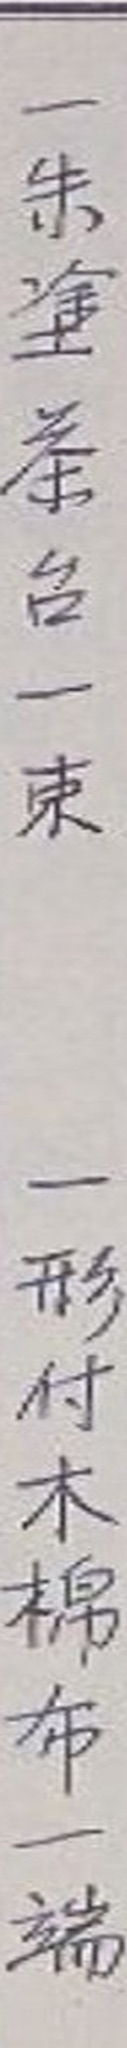一朱塗茶台一束一形付木棉布一端
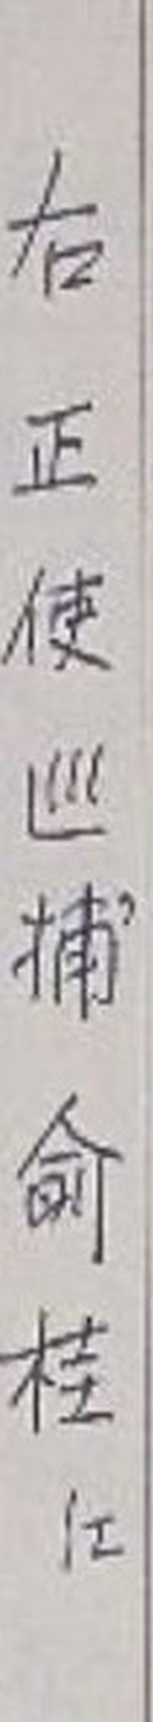右正使巡捕兪桂え
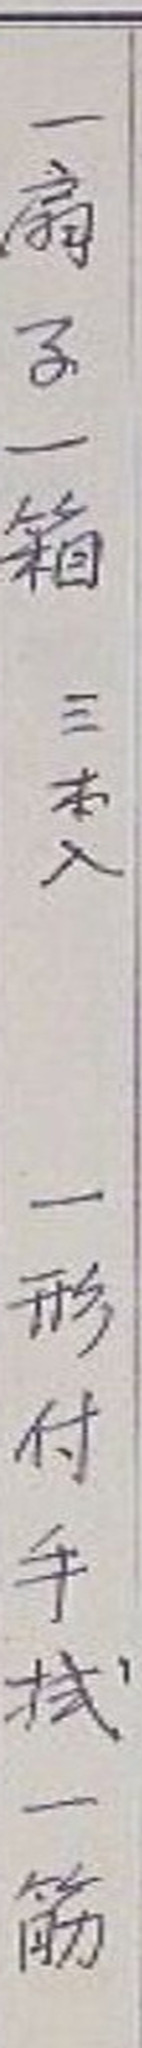一扇子一箱三本入一形付手拭一筋
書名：支那冊封使来琉諸記 下巻
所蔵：University of the Ryukyus Library
